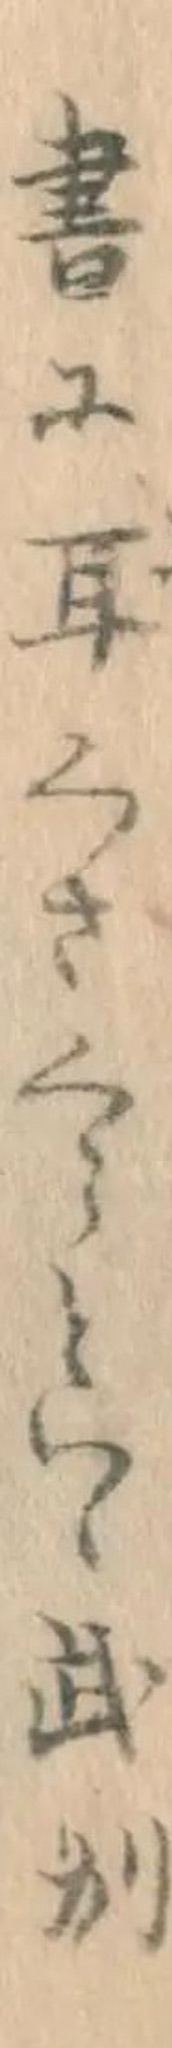書に耳くさくといゝ武州
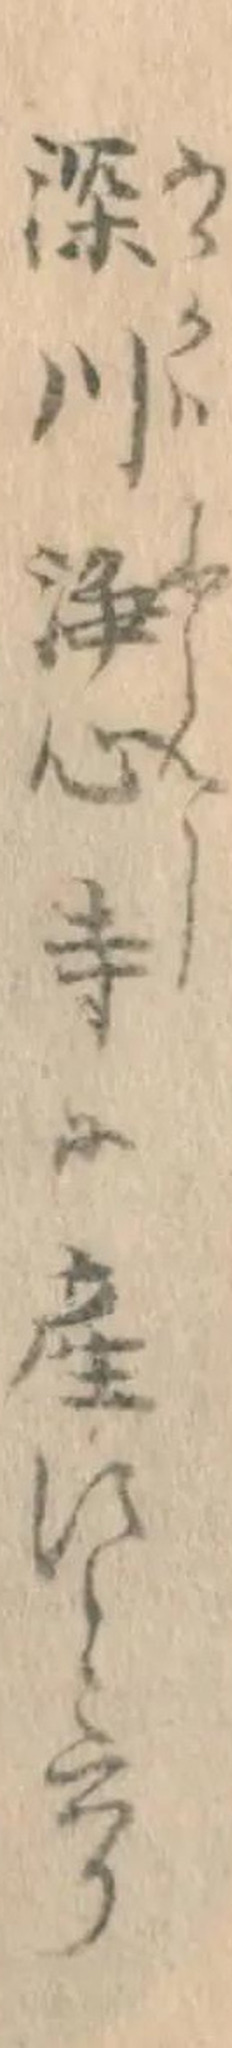深川浄心寺に産すと云り
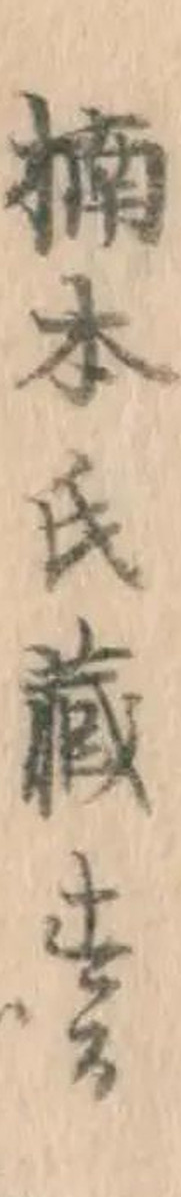楠本氏蔵する
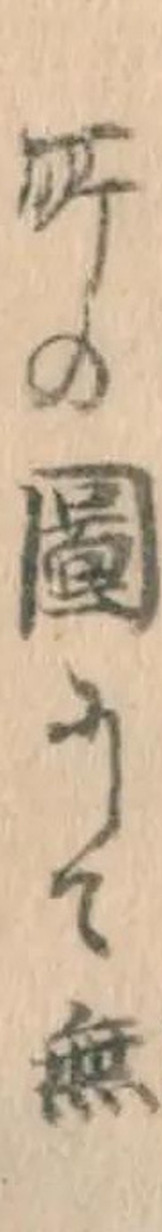所の図にして無
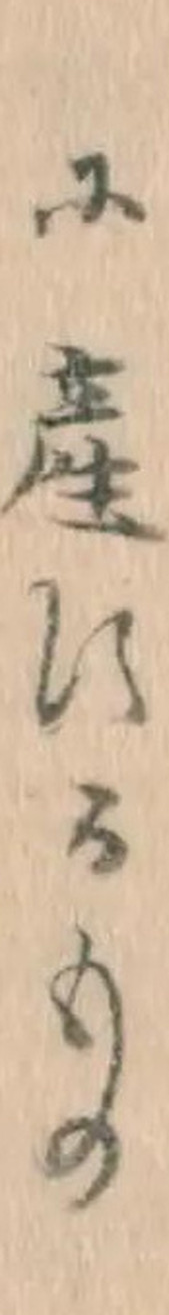に産するもの
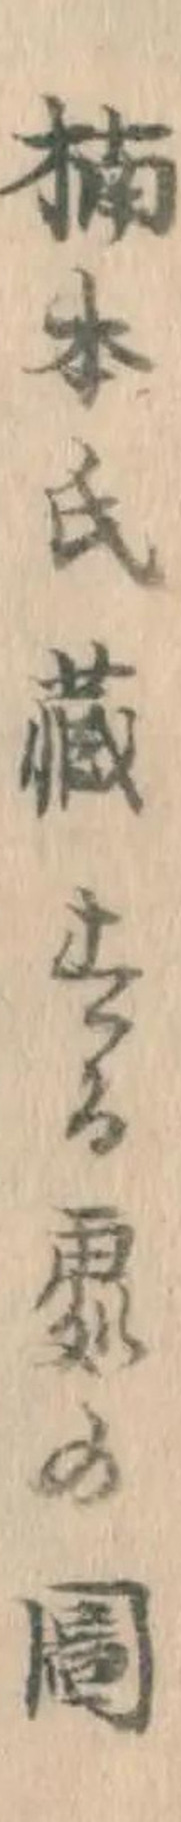楠本氏蔵する処の図
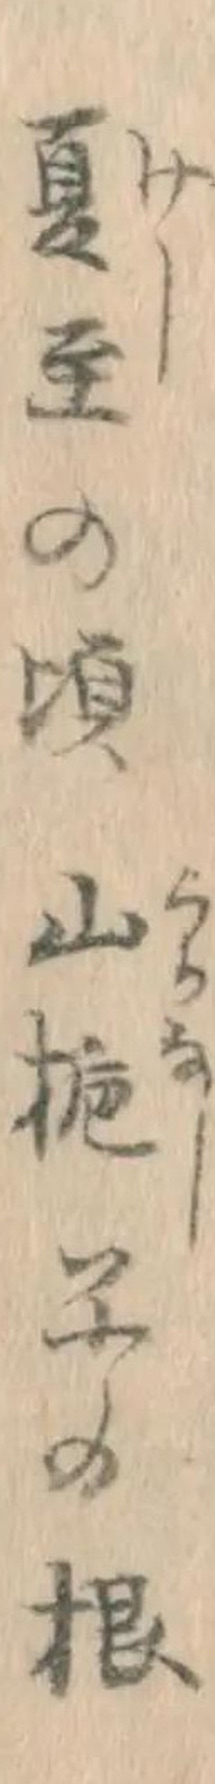夏至の頃山梔子の根
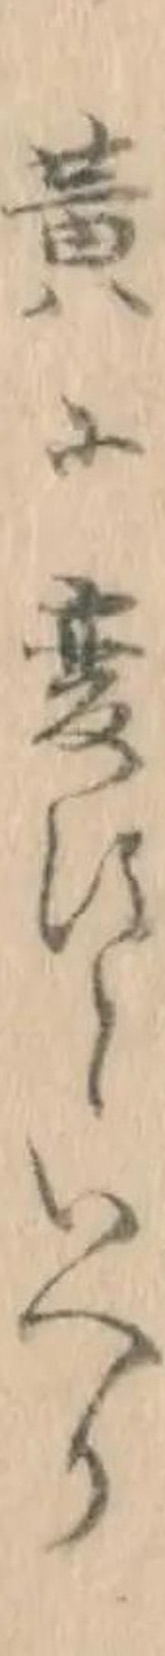黄に変すといへり

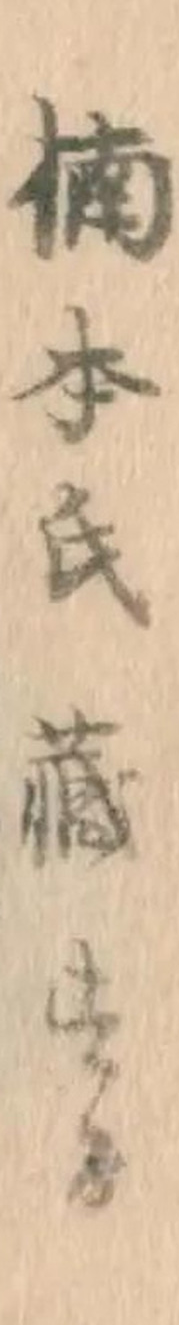楠本氏蔵する
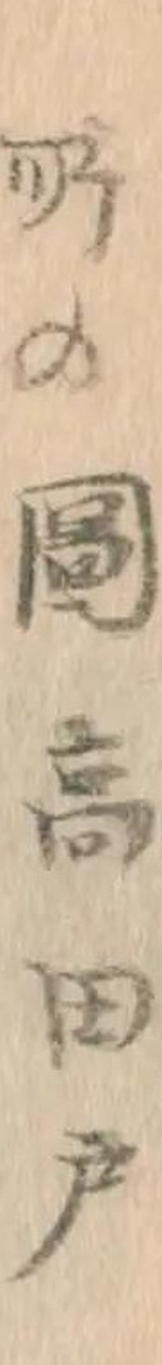所の図高田戸
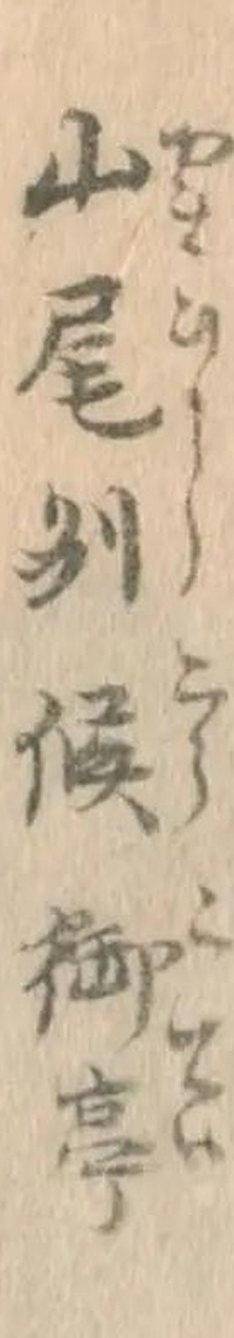山尾州候御亭
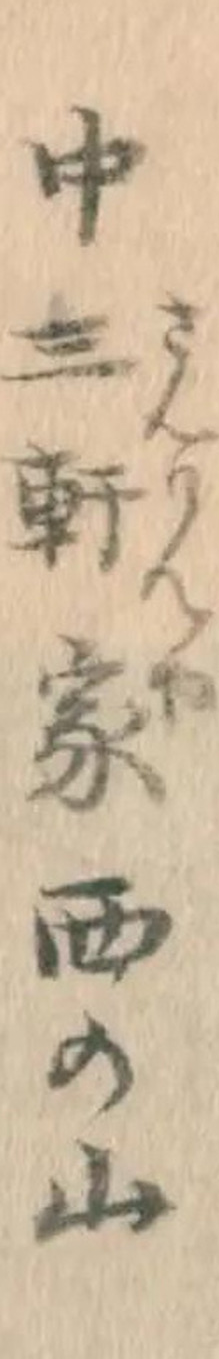中三軒家西の山
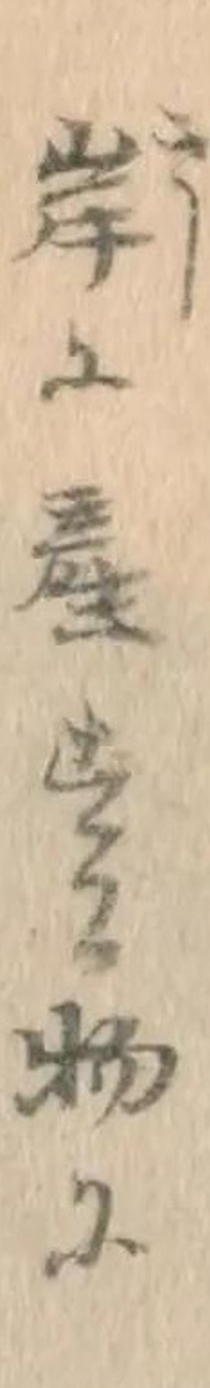岸に産する物に
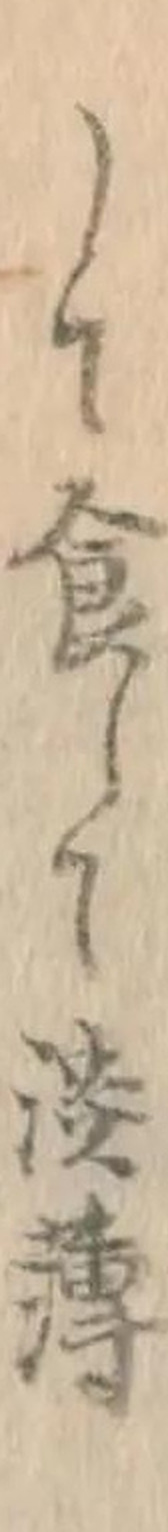して食して淡薄
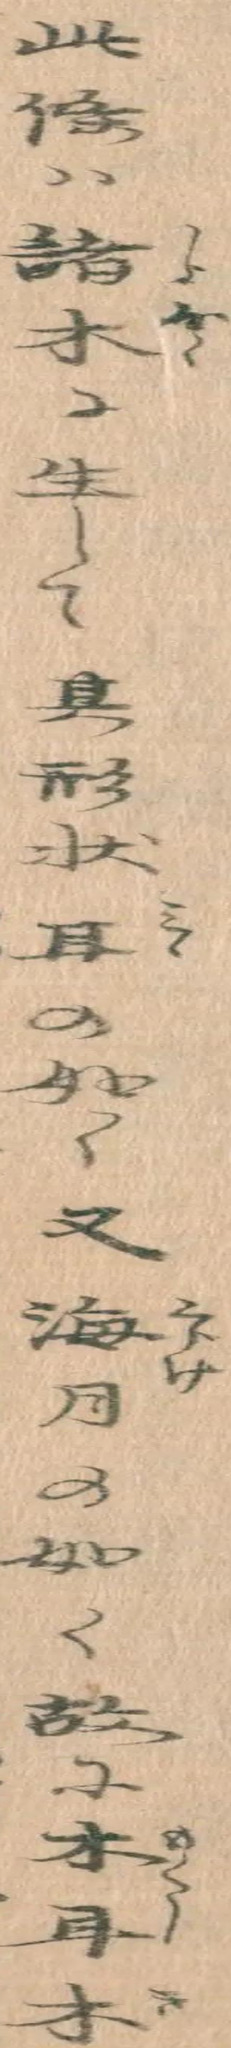此条は諸木に生して其形状耳の如く又海月の如く故に木耳木
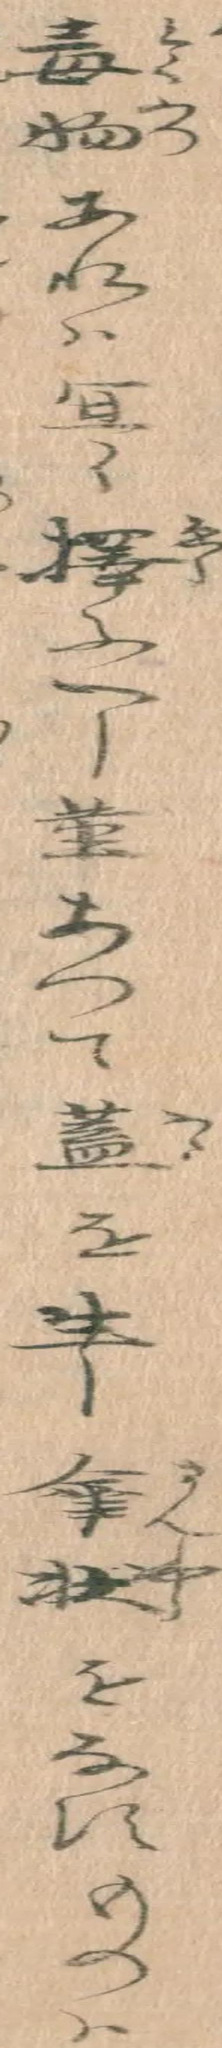毒物あれは宜く択ふへし茎あつて蓋を生し傘状をなすものは
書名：本草図譜. 巻55-57
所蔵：国立国会図書館 National Diet Library, JAPAN
